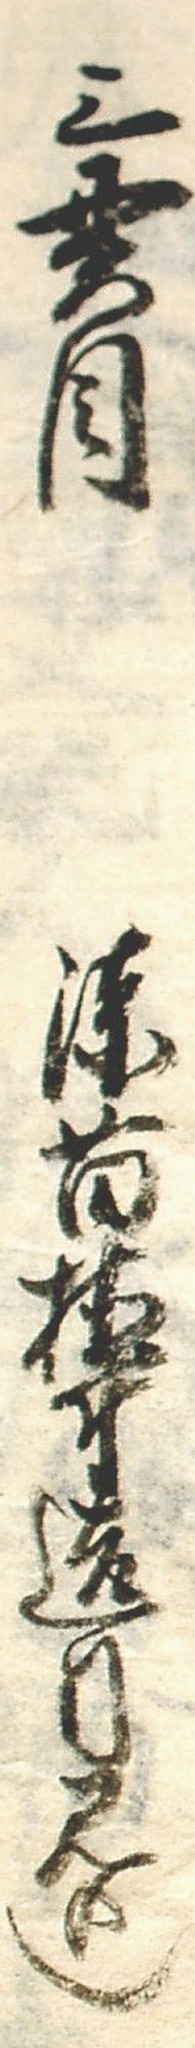三貫目漆苗植付造目見込
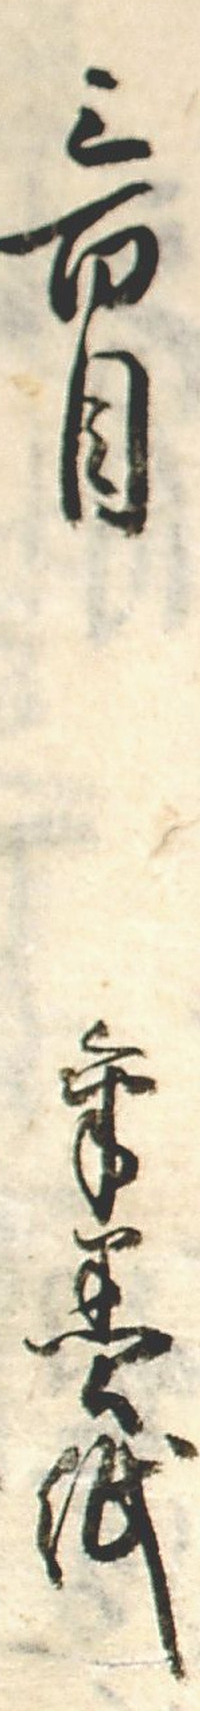三百目筆墨紙
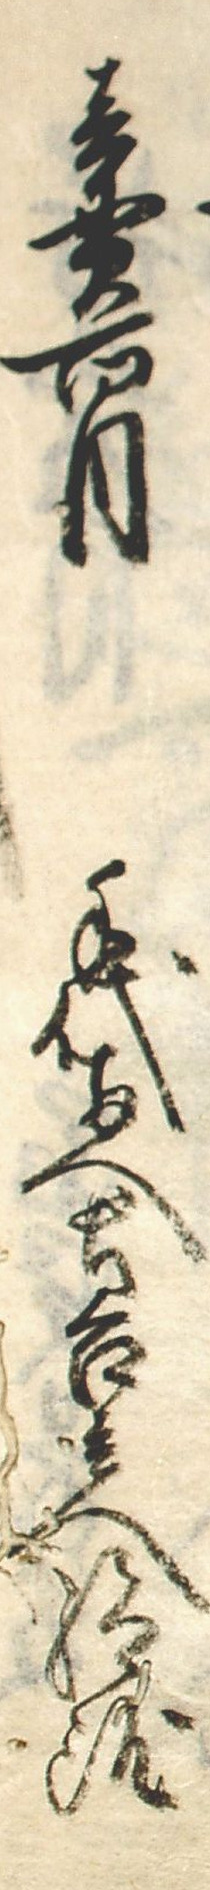壱貫百目手代両人長合壱人給銀

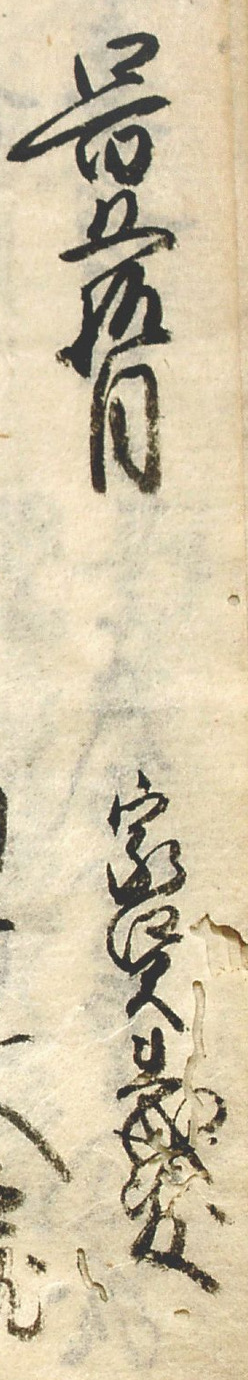四百五拾目家賃歳敷
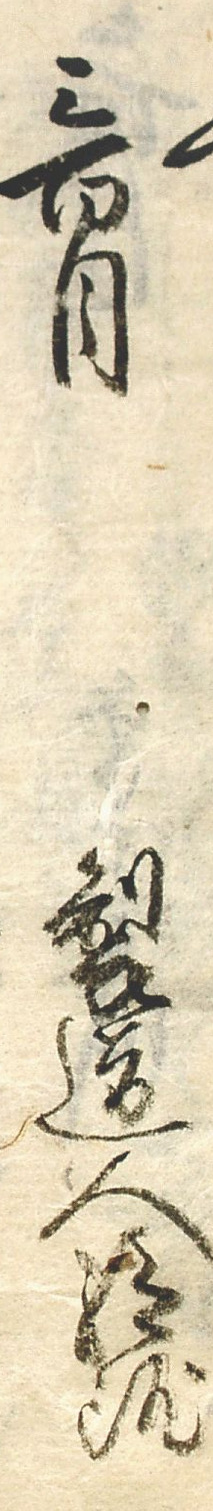三百目製造人給銀
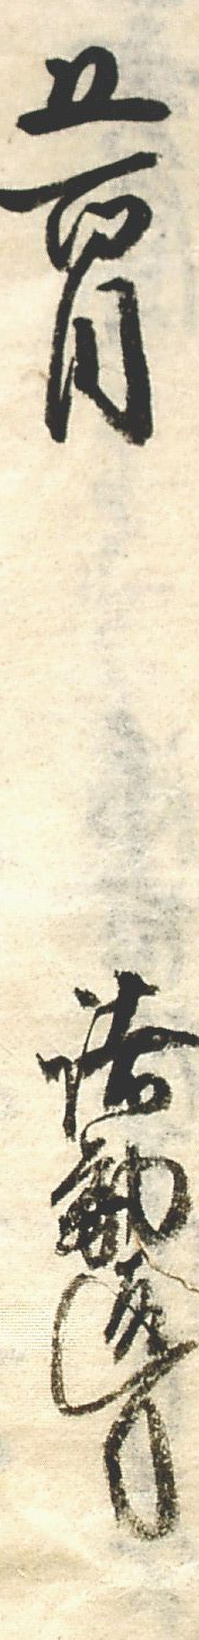五百目諸勤造引
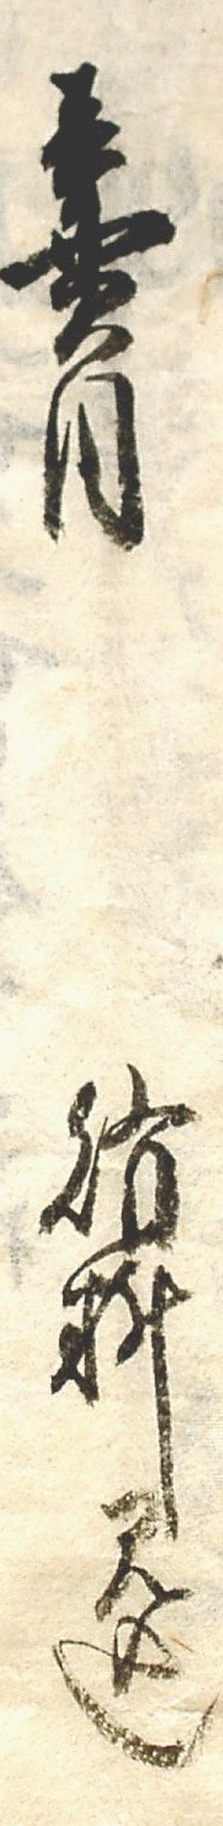壱貫目賄料見込
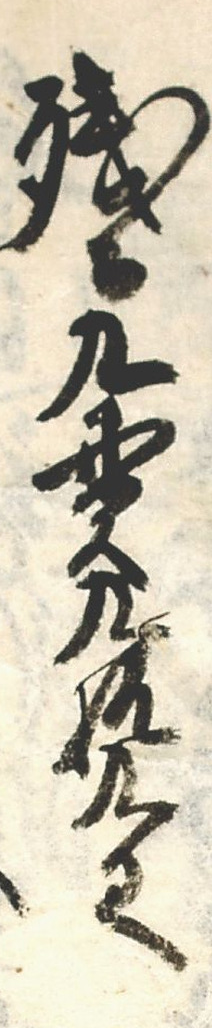残而九貫九拾九匁
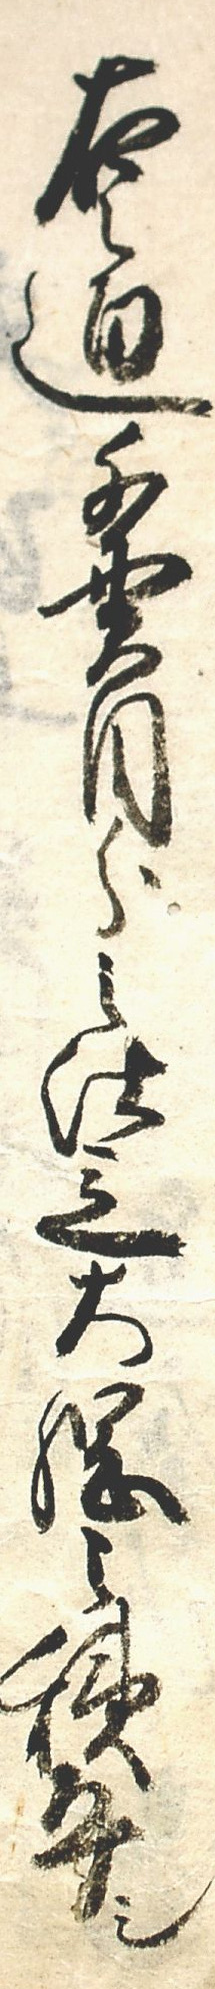右之通千貫目分之仕立大綱之積平し
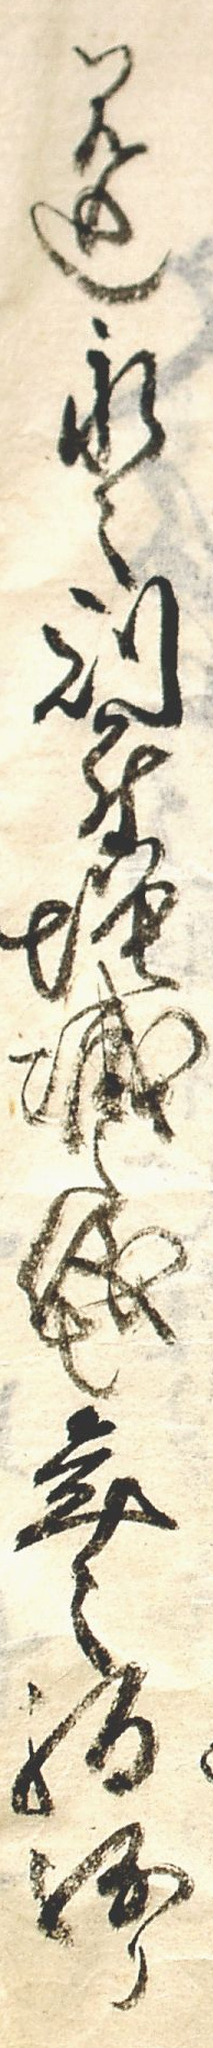見込永々割付増減之儀は年々指残り
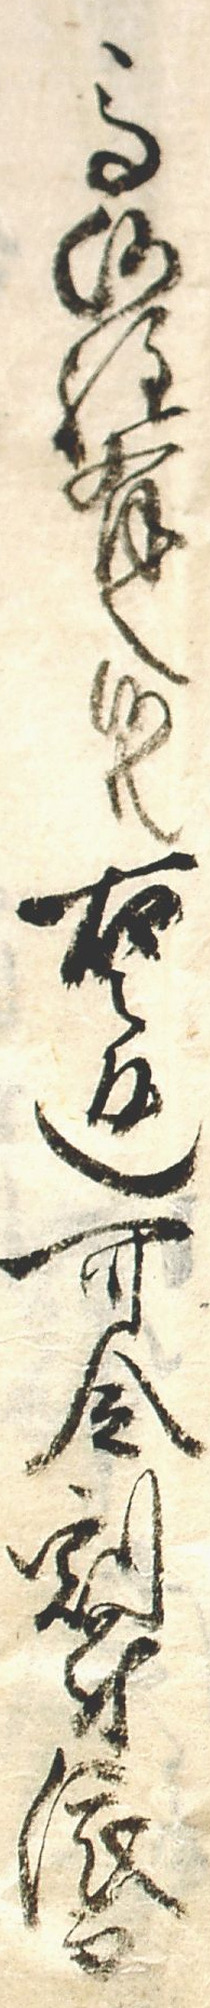高何程有之候共右之通可令割付依而
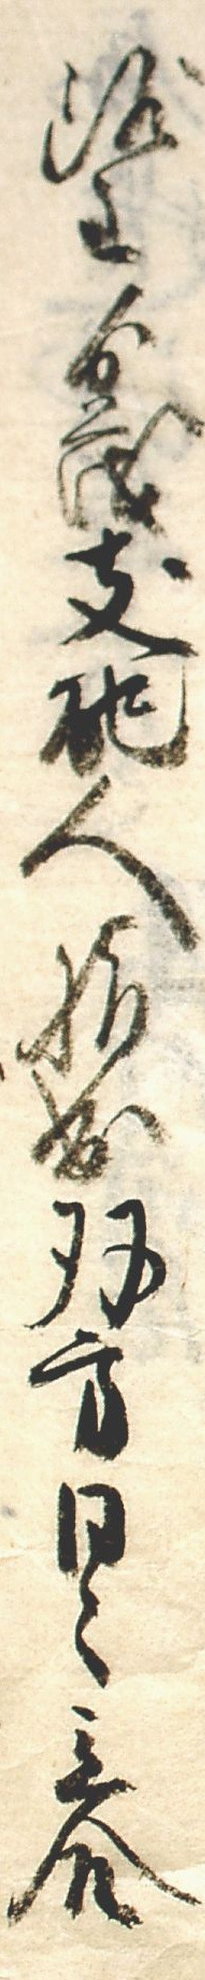銀主ゟも支配人指出双方日々立合
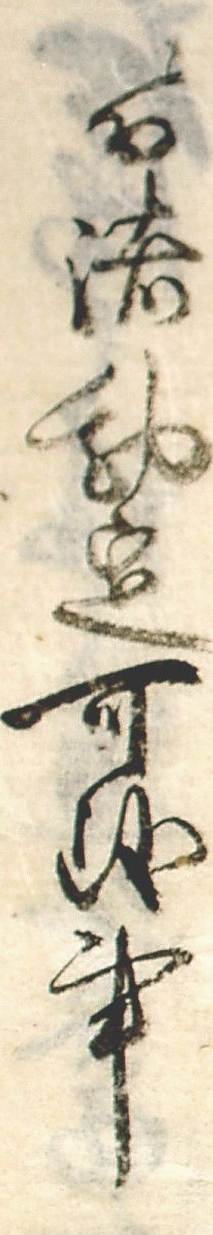に而諸勘定可致事

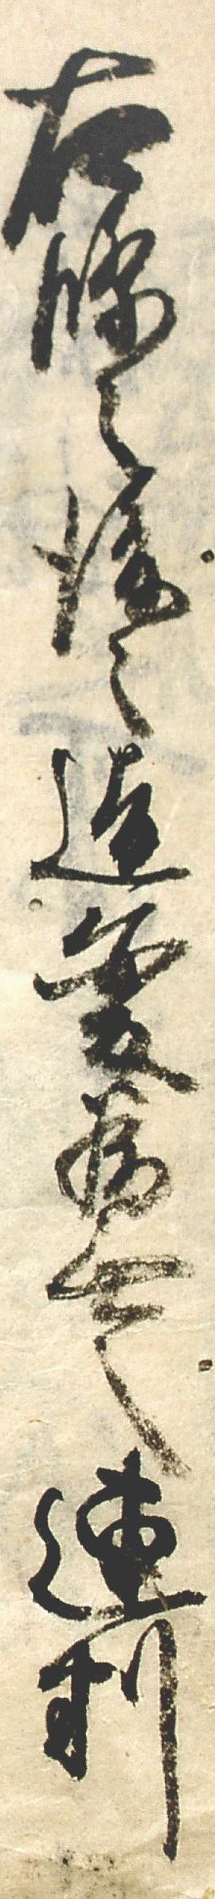右条々後々違変為無之連判
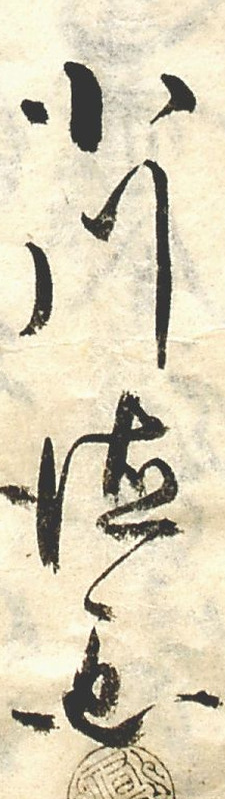小川徳兵衛
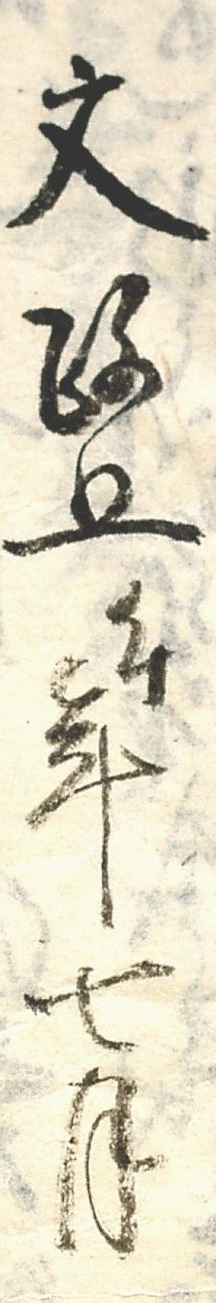文政五午年七月
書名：御国産漆製法越法算建書共取替速判帳
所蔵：鳴門教育大学 Naruto University of Education
